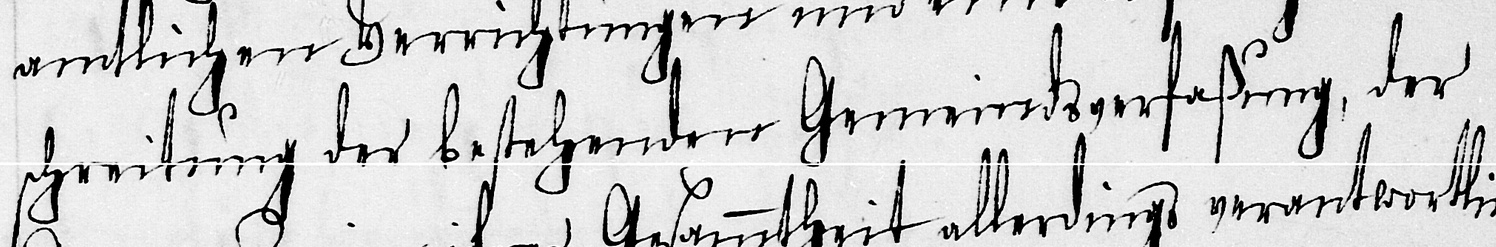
schreitung der bestehenden Gemeindsverfaßung, der
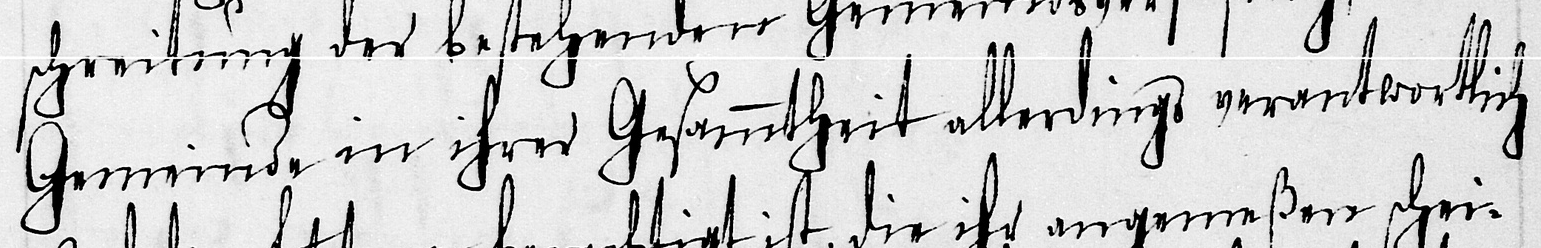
Gemeinde in ihrer Gesammtheit allerdings verantwortlich
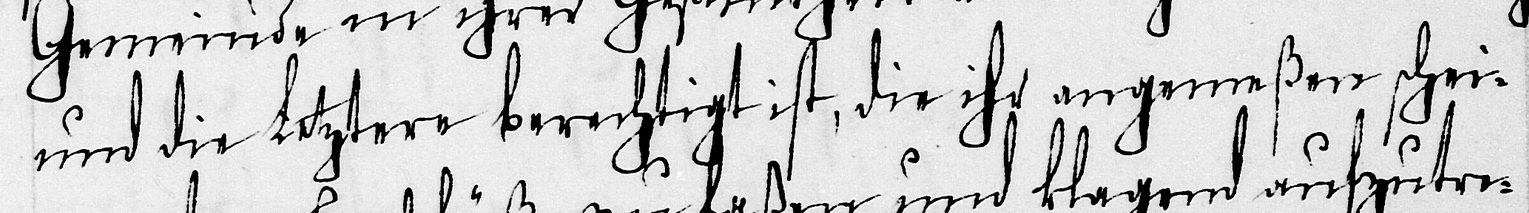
und die Letztere berechtigt ist, die ihr angemeßen schei¬
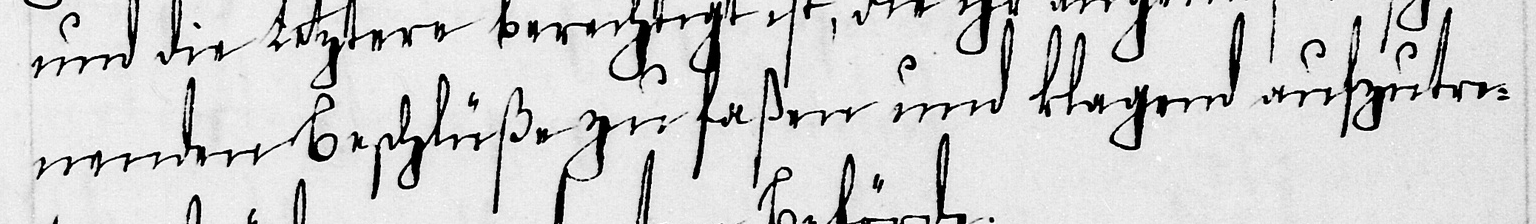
nenden Beschlüße zu faßen und klagend aufzutre¬
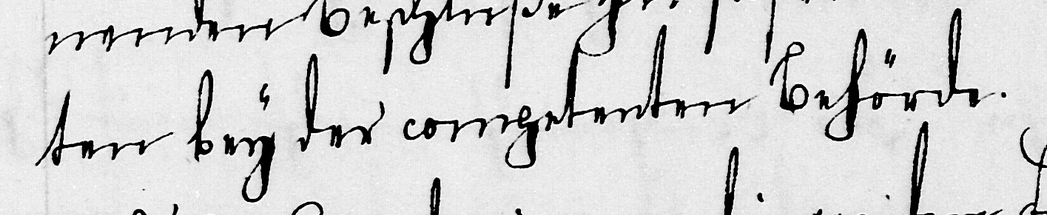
ten bey der competenten Behörde.
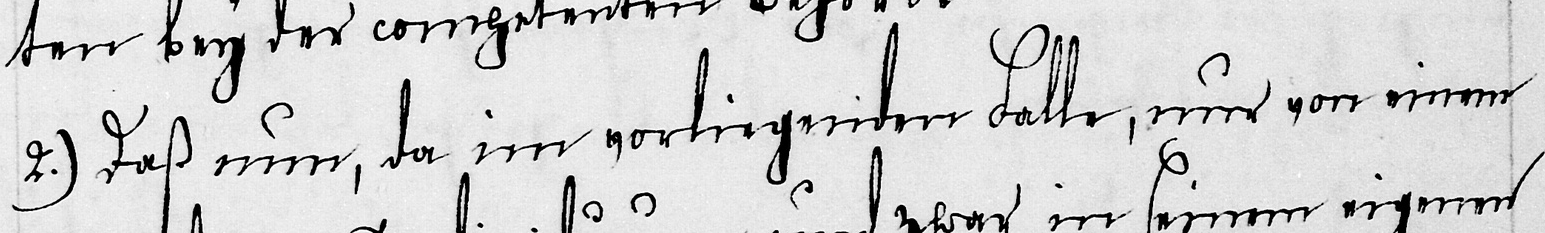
2.) Daß nun, da im vorliegenden Falle, nur von einem
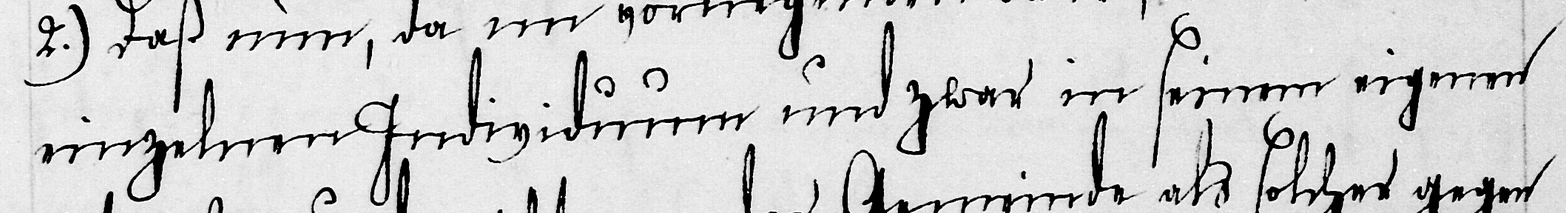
einzelnen Individuum und zwar in seinem eigenen
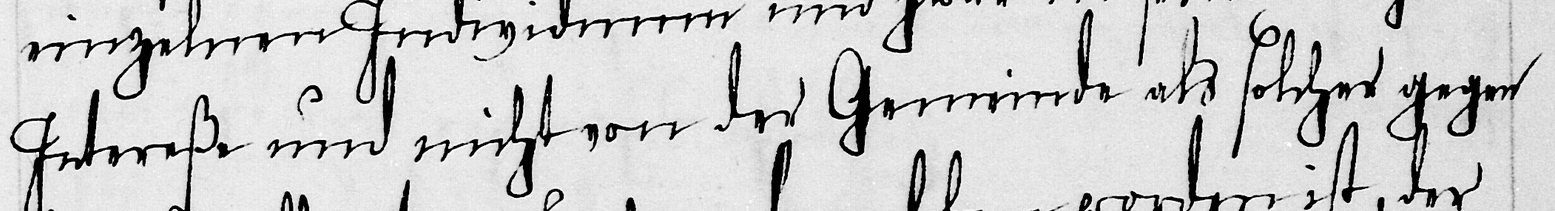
Intereße und nicht von der Gemeinde als solcher gegen
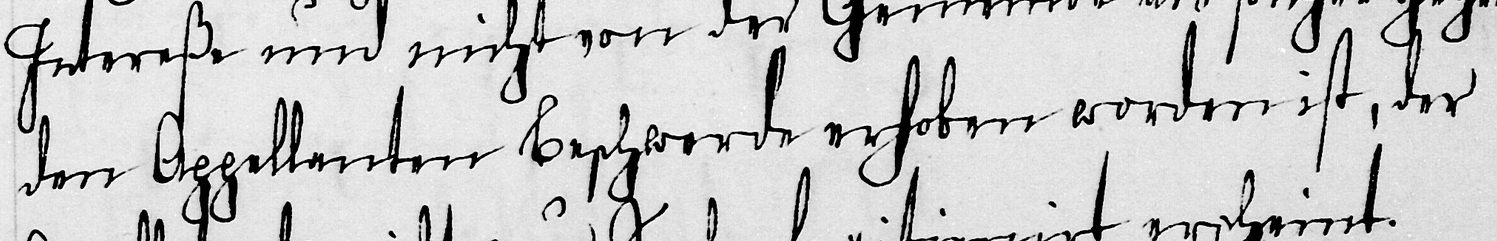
den Appellanten Beschwerde erhoben worden ist, der
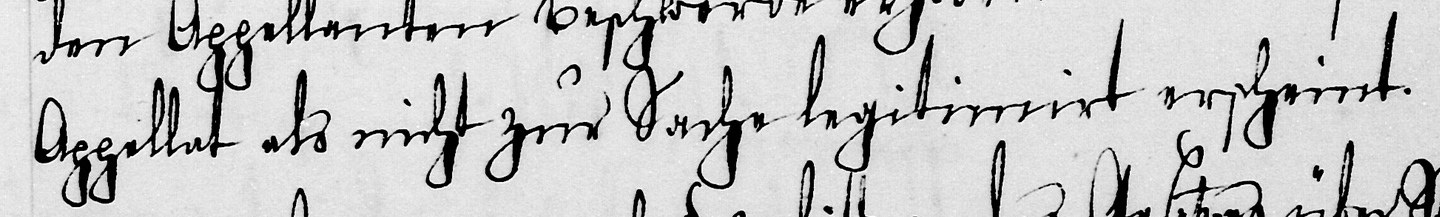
Appellat als nicht zur Sache legitimirt erscheint.
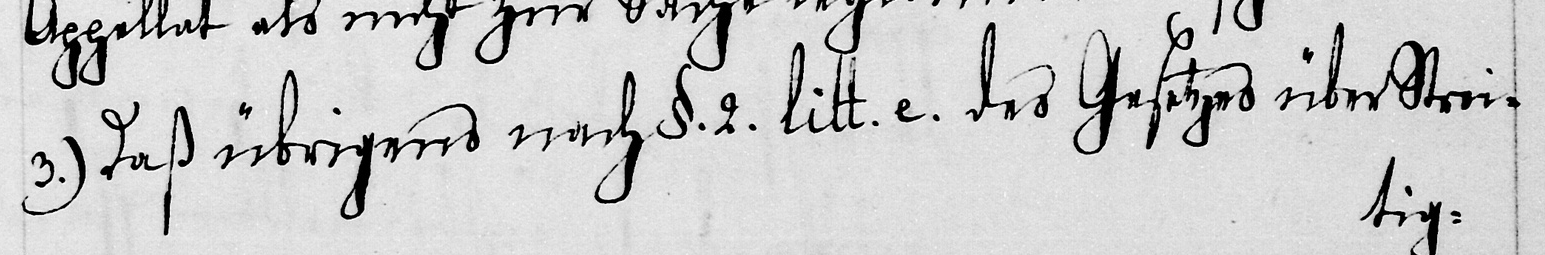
3.) Daß übrigens nach §. 2. litt. e. des Gesetzes über Strei-
